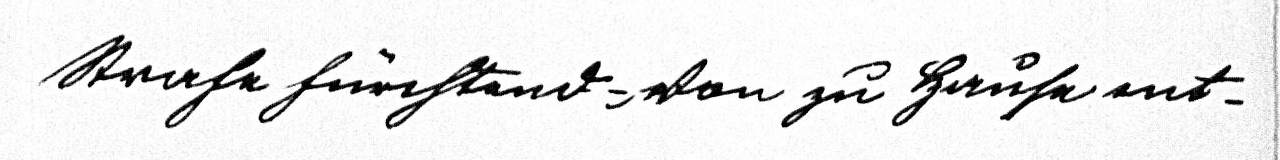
Strafe fürchtend = von zu Hause ent¬
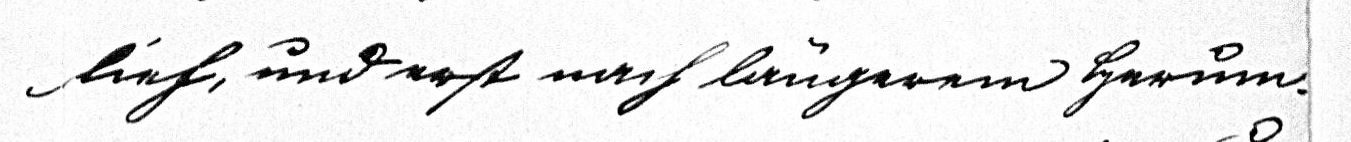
lief, und erst nach längerem Herum¬
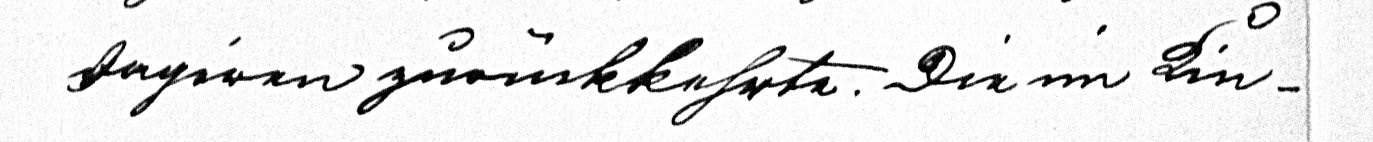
vagiren zurückkehrte. Die im Kin¬
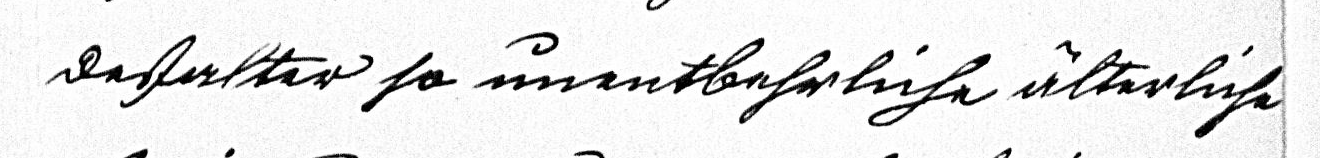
desalter so unentbehrliche älterliche
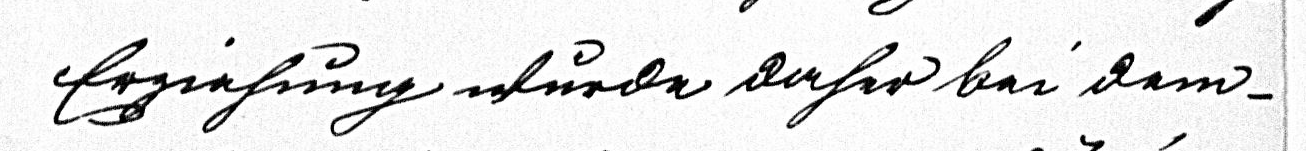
Erziehung wurde daher bei dem¬
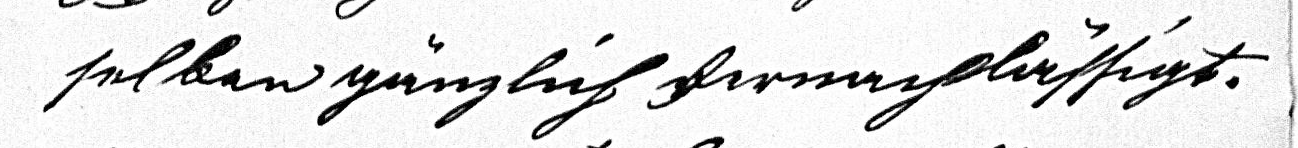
selben gänzlich vernachlässigt.
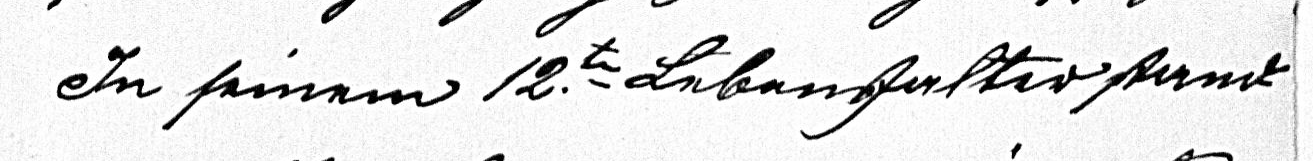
In seinem 12.ten Lebensalter stand
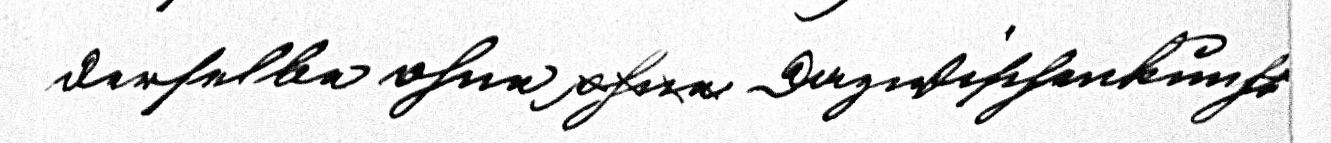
derselbe ohne Dazwischenkunft
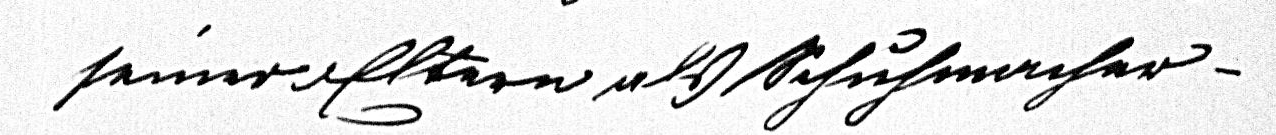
seiner Eltern als Schuhmacher -
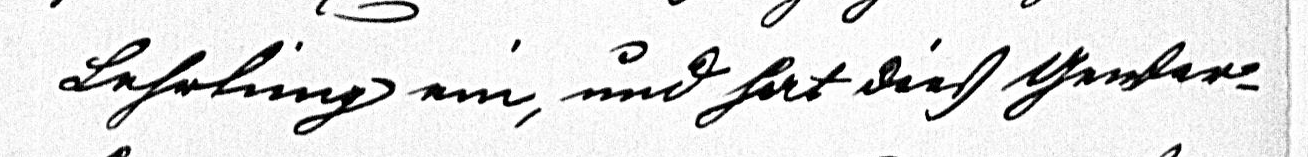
Lehrling ein, und hat dies Gewer¬
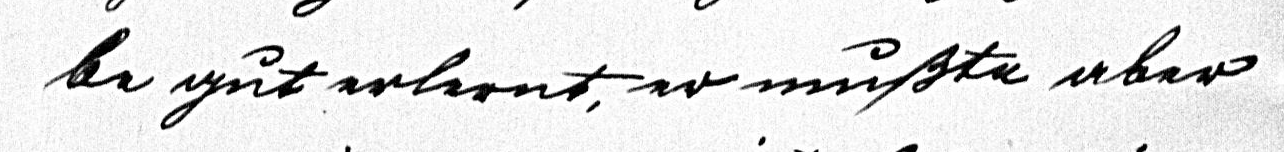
be gut erlernt, er mußte aber
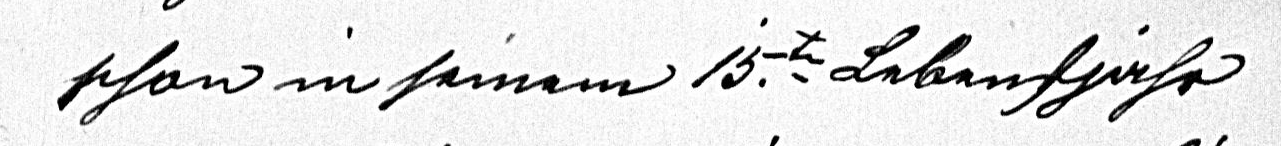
schon in seinem 15.ten Lebensjahr
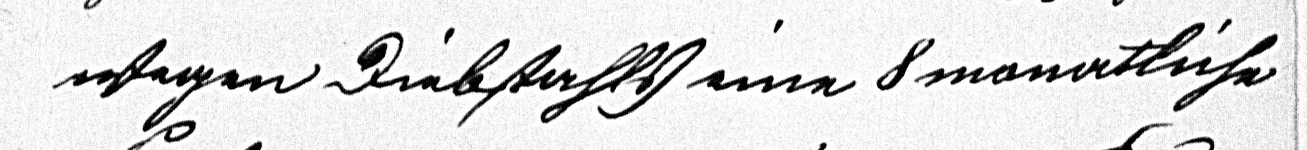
wegen Diebstahls eine 8 monatliche
